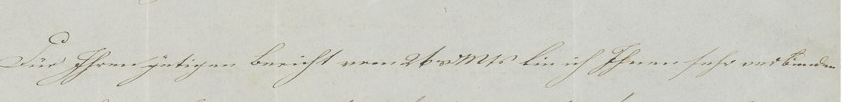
Für Ihren gütigen Bericht vom 26 v Mts bin ich Ihnen sehr verbunden
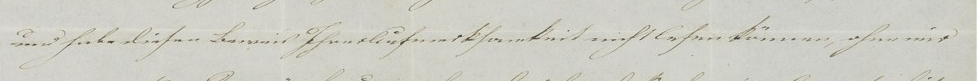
und habe diesen Beweis Ihrer Aufmerksamkeit nicht lesen können, ohne mir
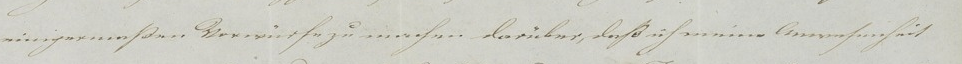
einigermaßen Vorwürfe zu machen darüber, daß ich meine Anwesenheit
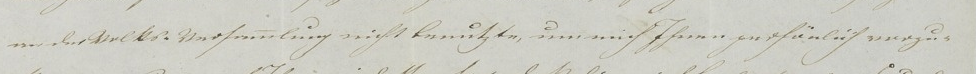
an der Volks-Versammlung nicht benutzte, um mich Ihnen persönlich vorzu-
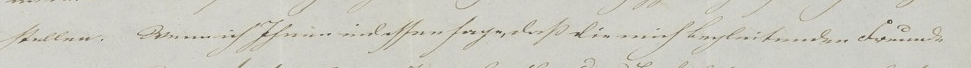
stellen. Wenn ich Ihnen indessen sage, daß die mich begleitenden Freunde
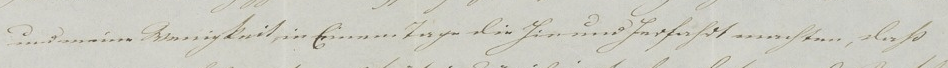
und meine Wenigkeit in Einem Tage die Hin- und Herfahrt machten, daß
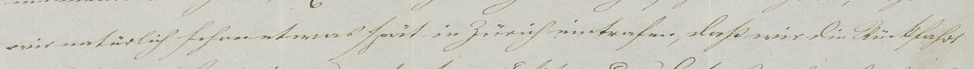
wir natürlich schon etwas spät in Zürich eintrafen, daß wir die Rückfahrt
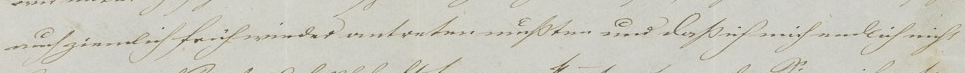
auch ziemlich früh wieder antreten mußten und daß ich mich endlich nicht
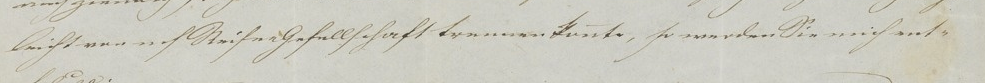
leicht von der Reise-Gesellschaft trennen konnte, so werden Sie mich ent-
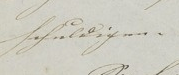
schuldigen. –
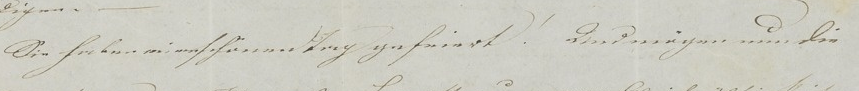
Sie haben einen schönen Tag gefeiert! Und mögen nun die
